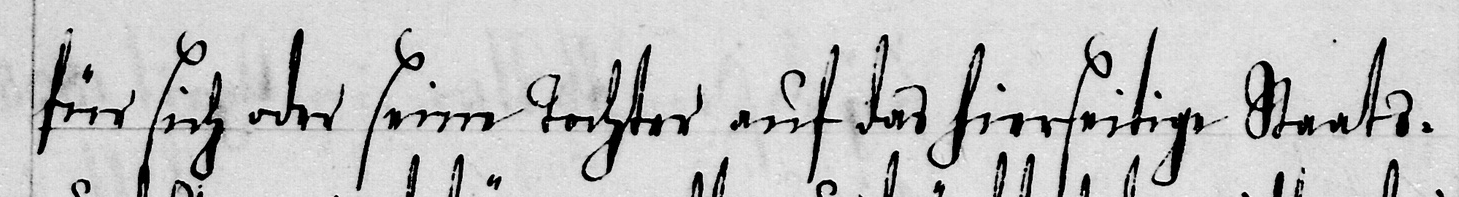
für sich oder seine Tochter auf das hierseitige Staats-
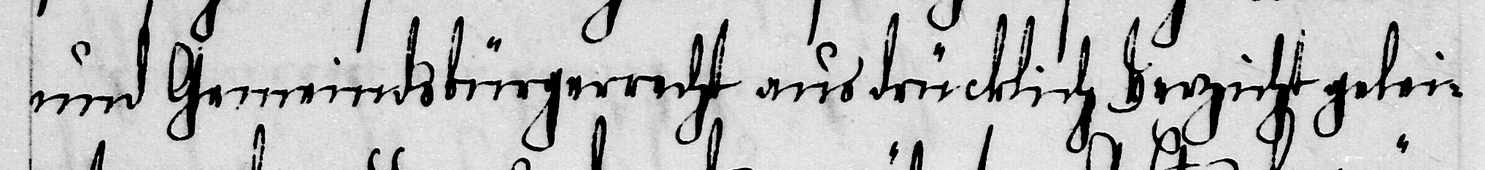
und Gemeindsbürgerrecht ausdrücklich Verzicht gelei¬
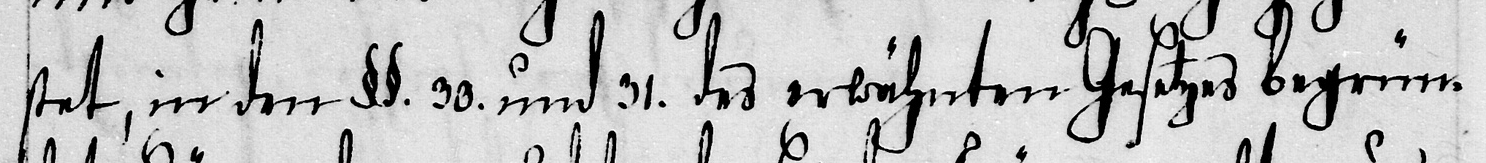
stet, in den §§. 30. und 31. des erwähnten Gesetzes begrün¬
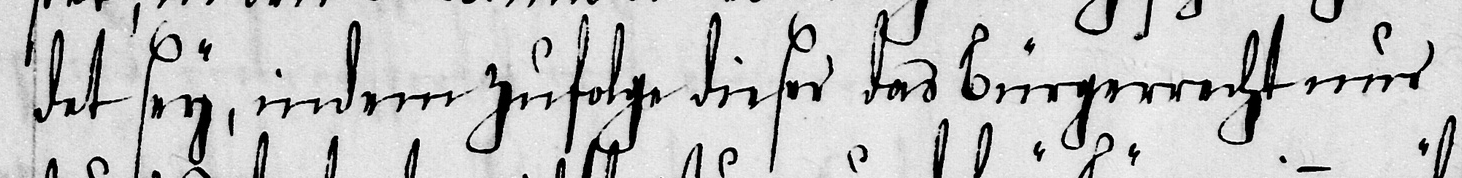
det sey, indem zufolge dieser das Bürgerrecht nur
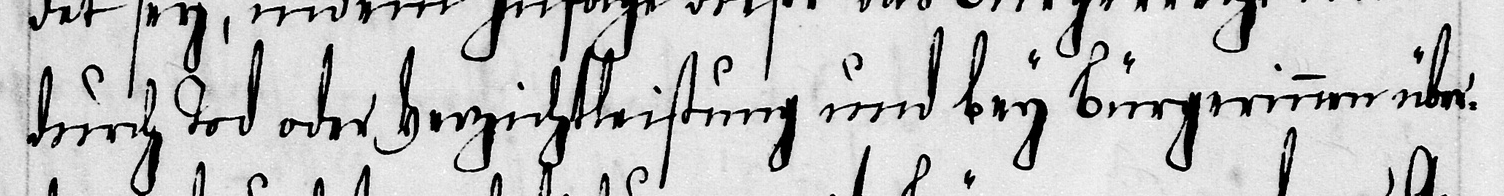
durch Tod oder Verzichtleistung und bey Bürgerinnen übe¬
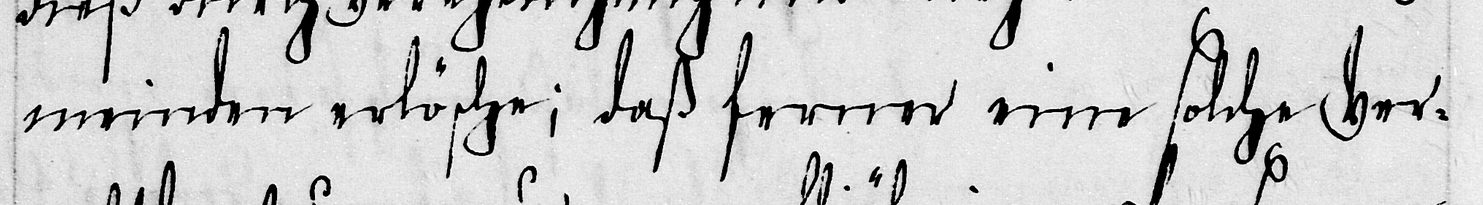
meinden erlösche; daß ferner eine solche Ver¬
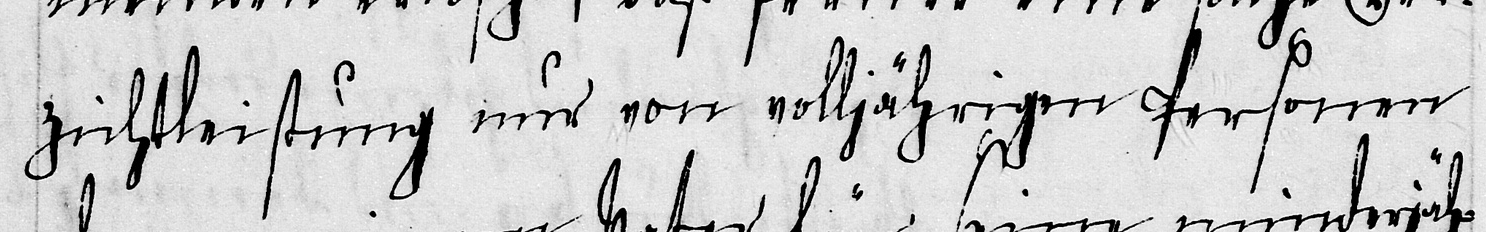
zichtleistung nur von volljährigen Personen
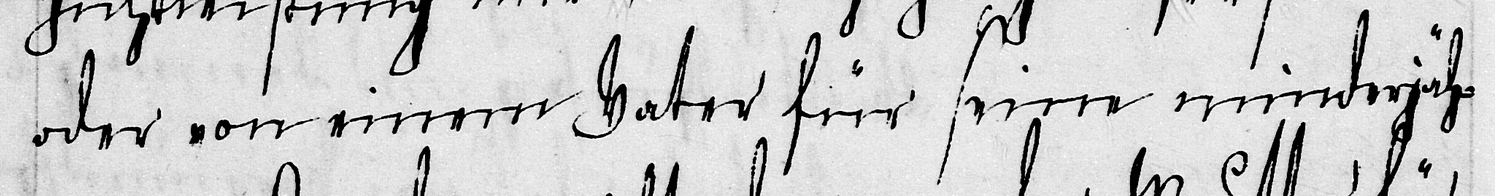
oder von einem Vater für seine minderjäh¬
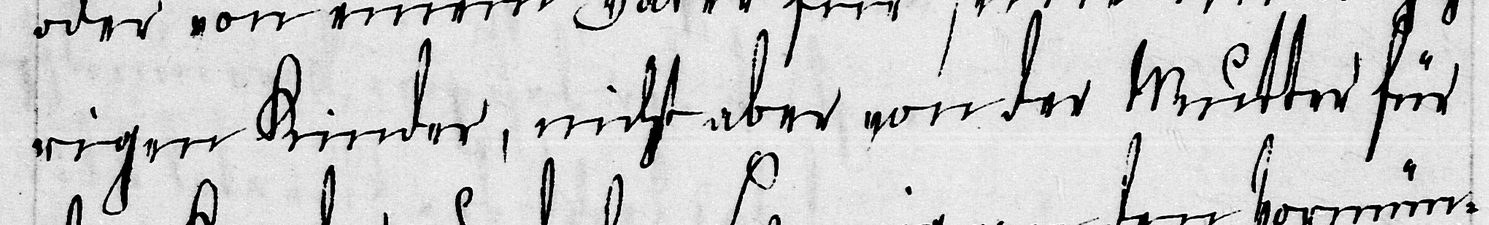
rigen Kinder, nicht aber von der Mutter für
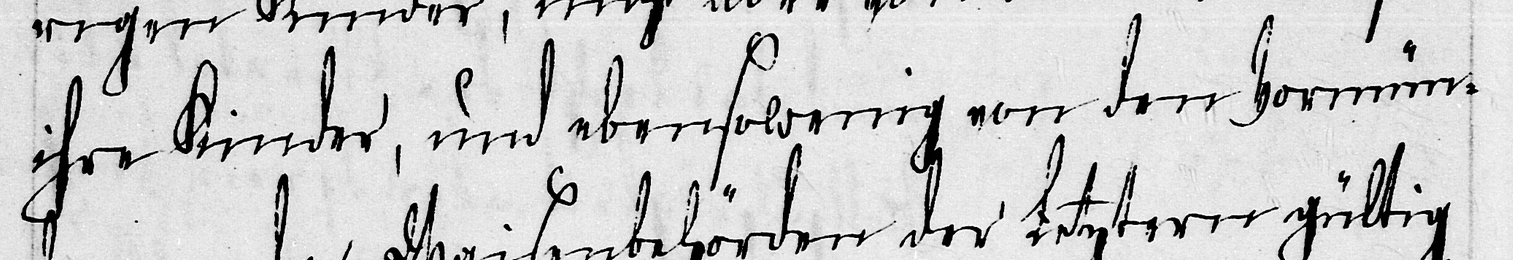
ihre Kinder, und ebensowenig von den Vormün¬
